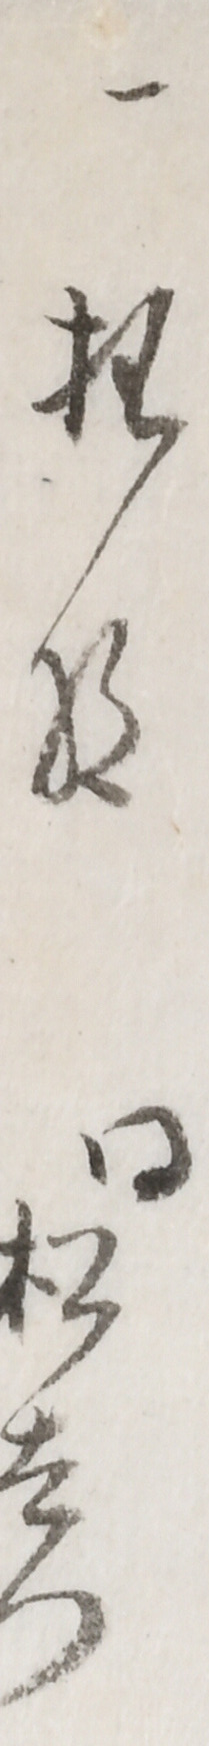一拾枚松右衛門
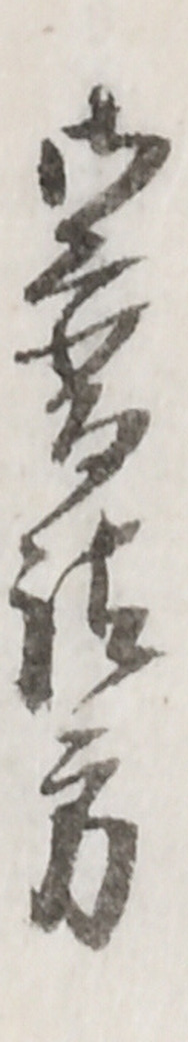御普請方
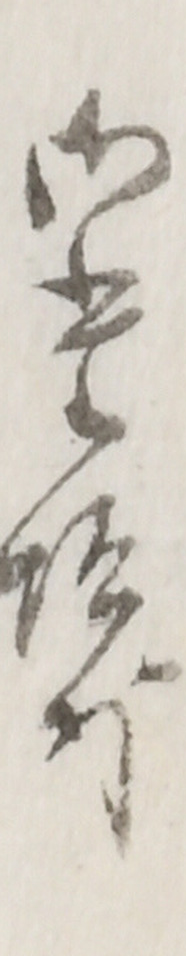御堂垣町
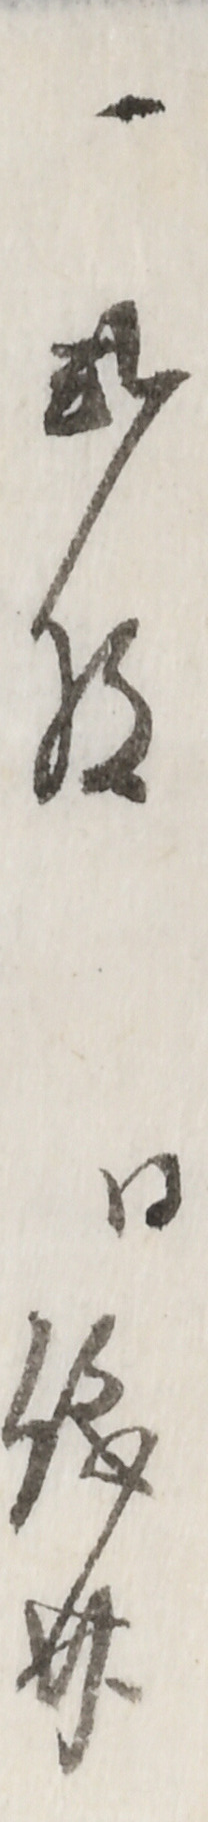一弐枚儀介
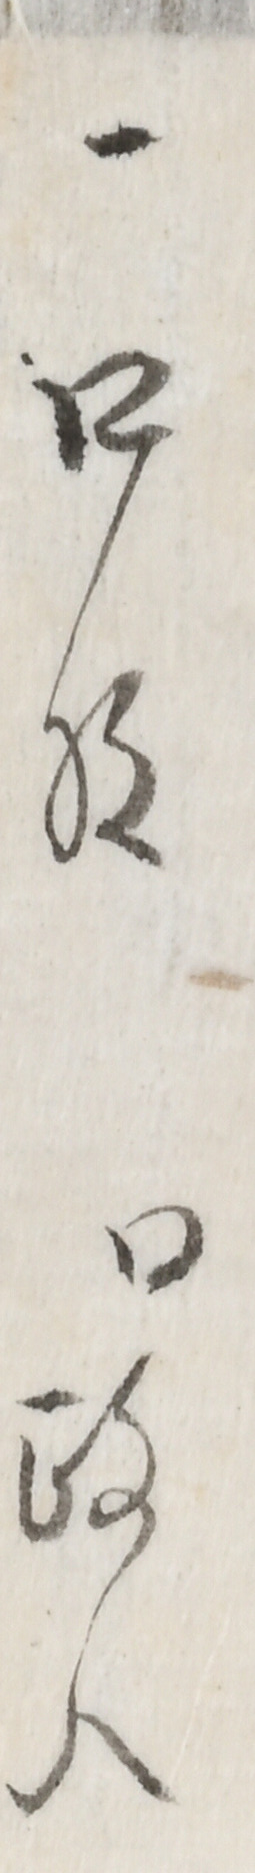一壱枚同人
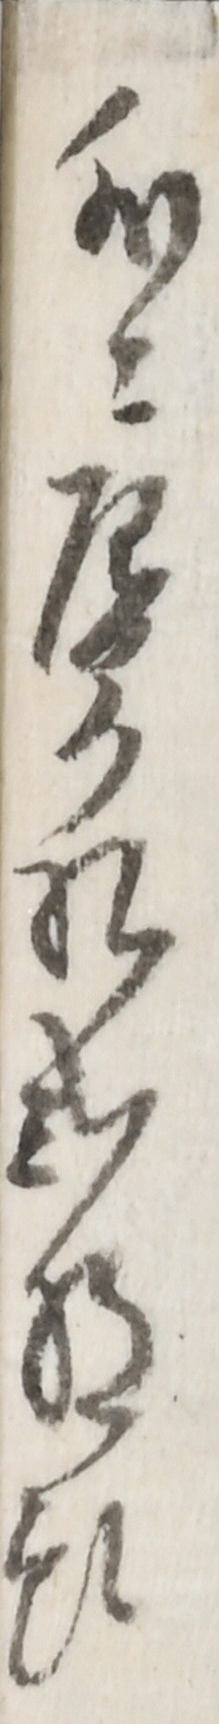外ニ贋札弐枚預

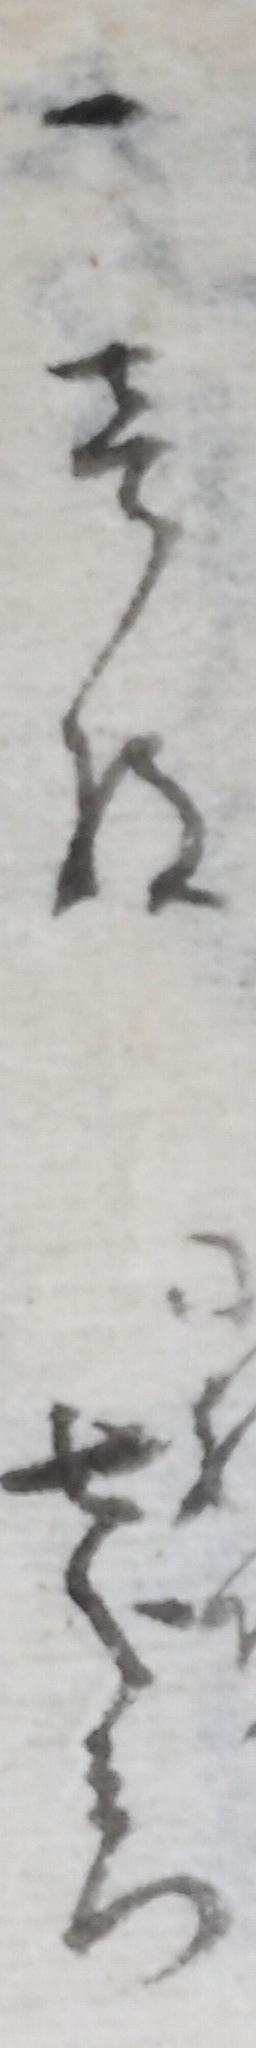一八枚利右衛門
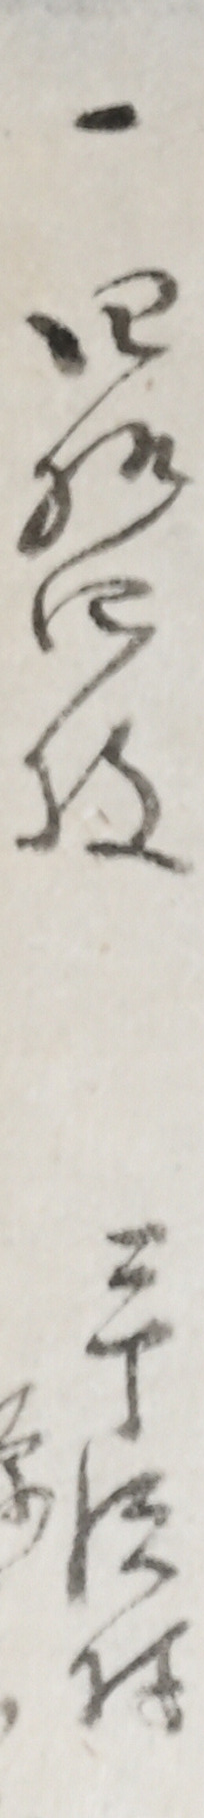一四拾四枚弥兵衛
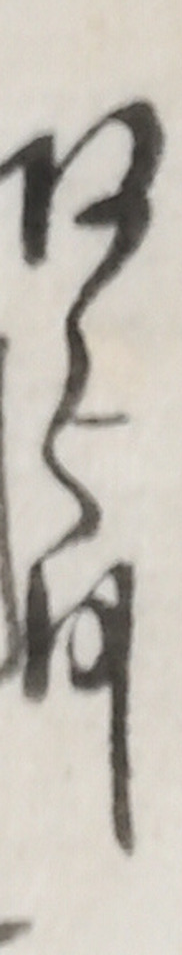あら町
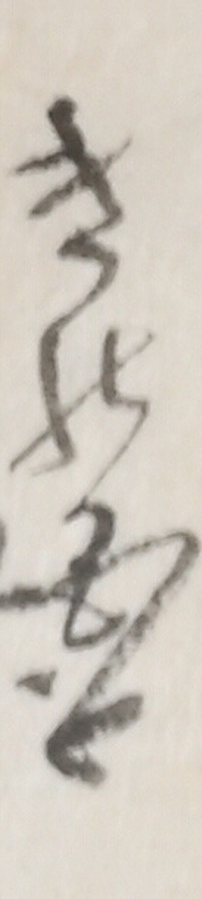きの国屋
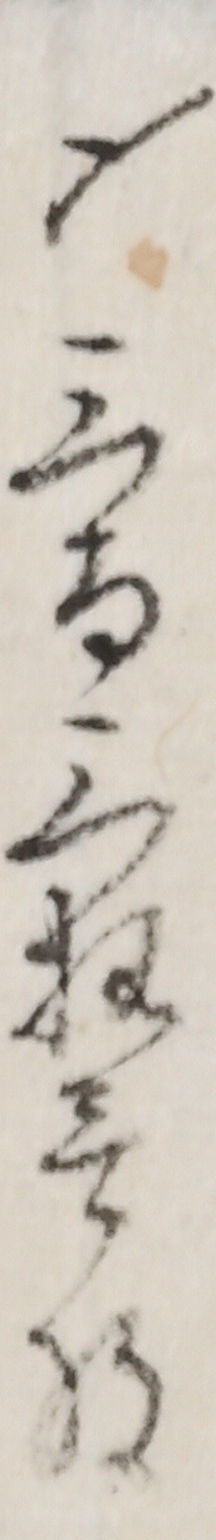〆三百三拾壱枚
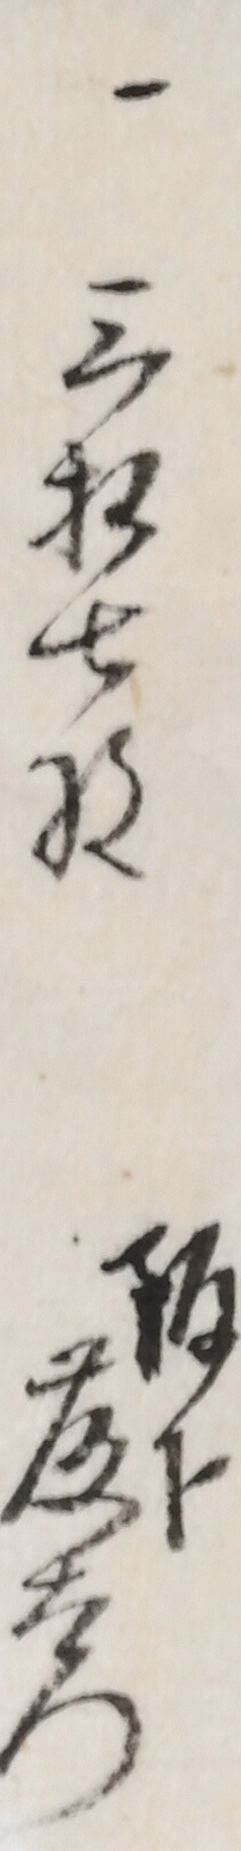一三拾七枚藤左衛門
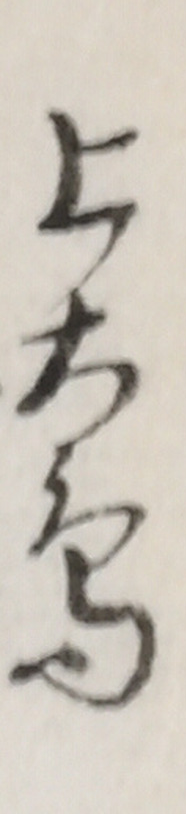上大島
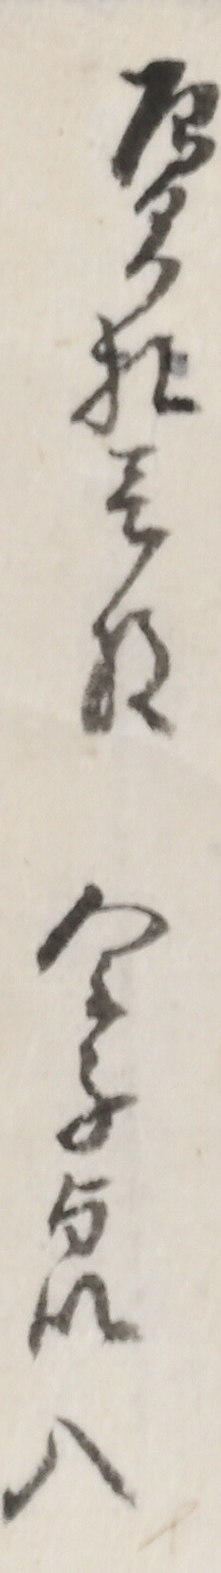贋札壱枚金子与以八
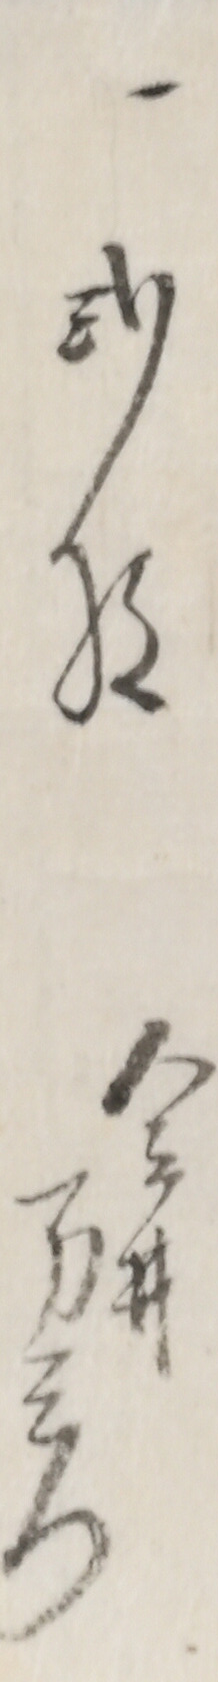一八枚利右衛門
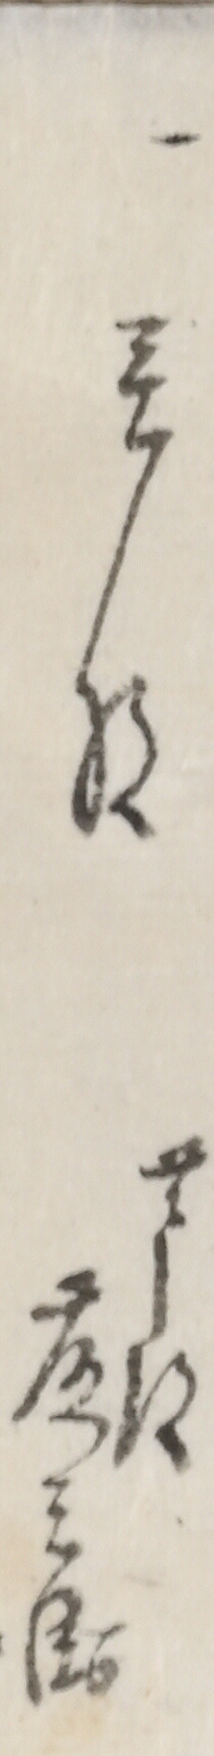一壱枚野兵衛
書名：髙遠限楮幣引換覚帳
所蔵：伊那市立高遠町図書館・合同会社AMANE
